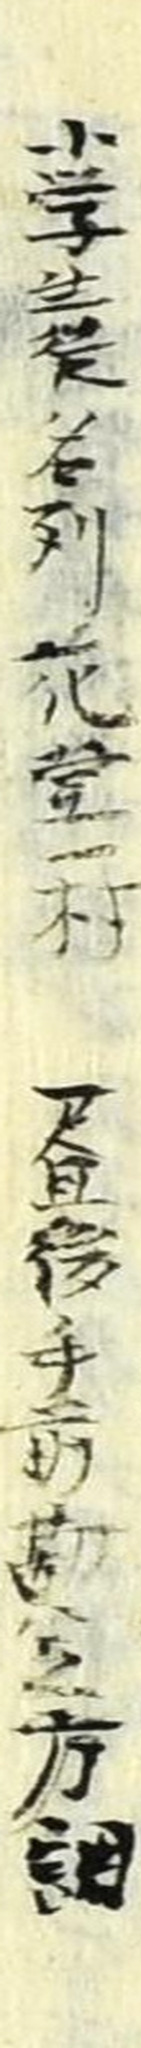小学生徒名列花堂一村昼後手前勘定方調
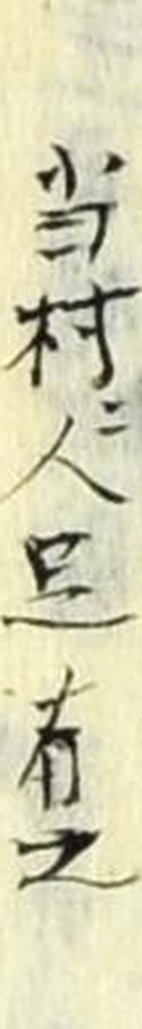当村ニ人足有之
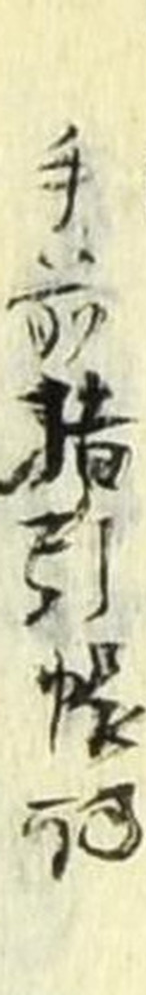手前指引帳調
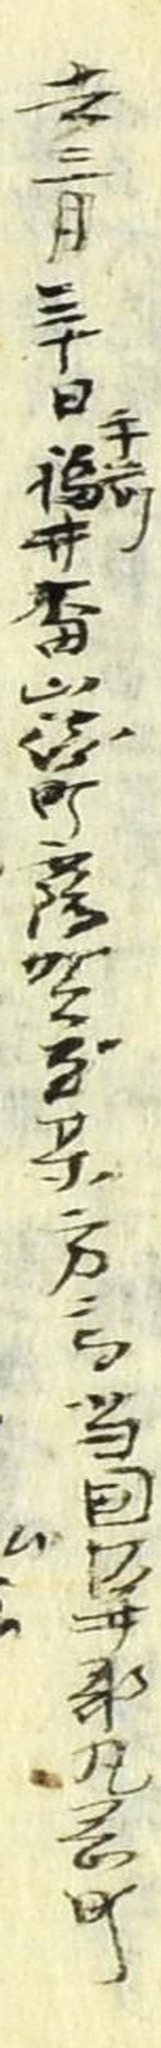去三月三十日手前福井木田山崎町鶴賀屋某方ニ而当国坂井郡丸岡町
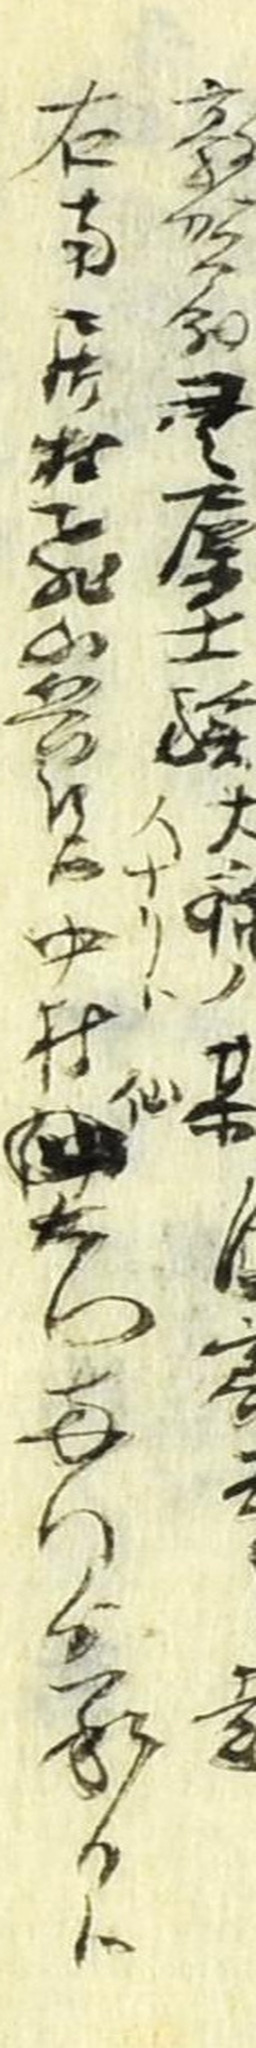右南居村飛山兵左衛門中村仙右衛門両人ゟ承り候
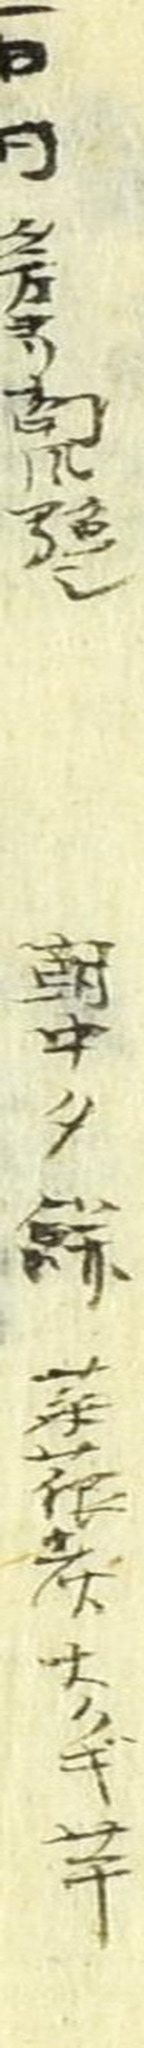三日同夕方ヨリ南風強シ朝中夕餅菜菔煮大クギ芋
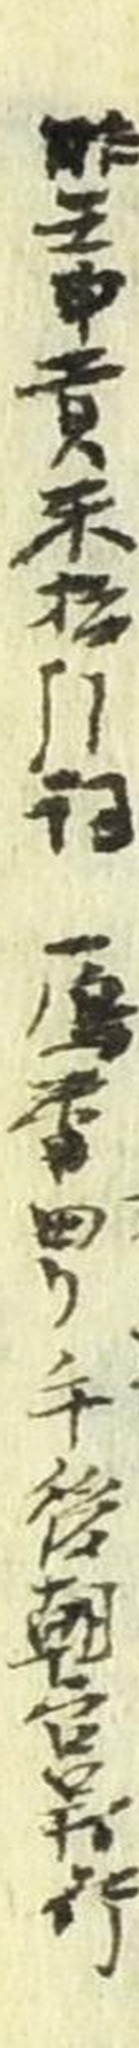昨壬申貢米指引調雁番回リ午後朝宮村行
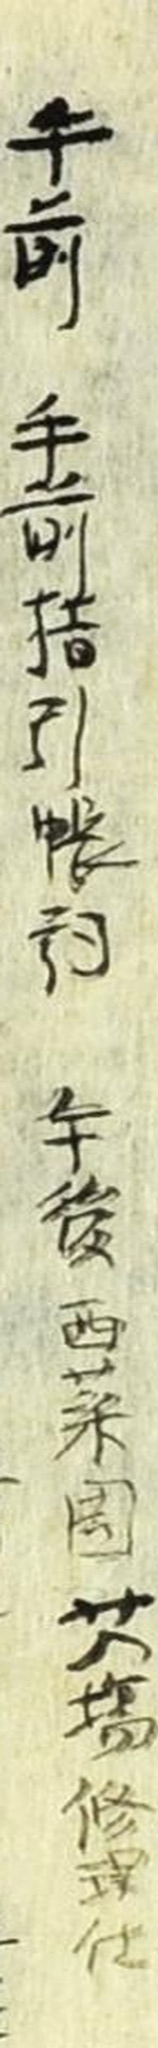午前手前指引帳調午後西菜園艾場修理仕
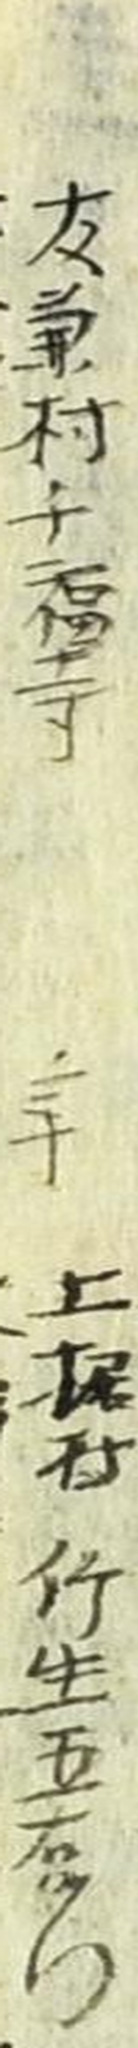友兼村千福寺年上据村竹生五右衛門
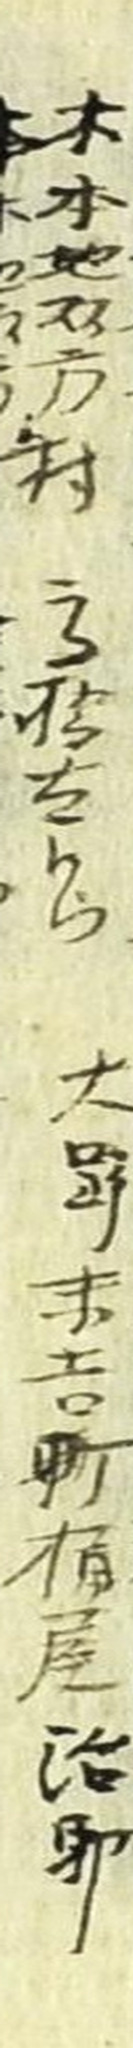木本地頭方村高橋太左衛門大野末吉町桶屋治助
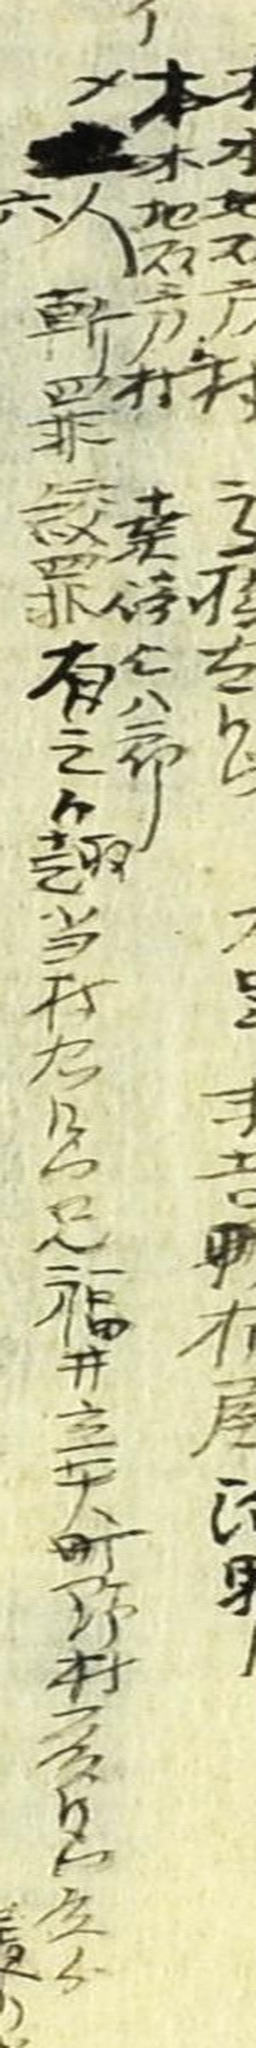〆六人斬罪絞罪有之候趣当村忠左衛門兄福井立矢町野村藤左衛門殿ゟ承リ候
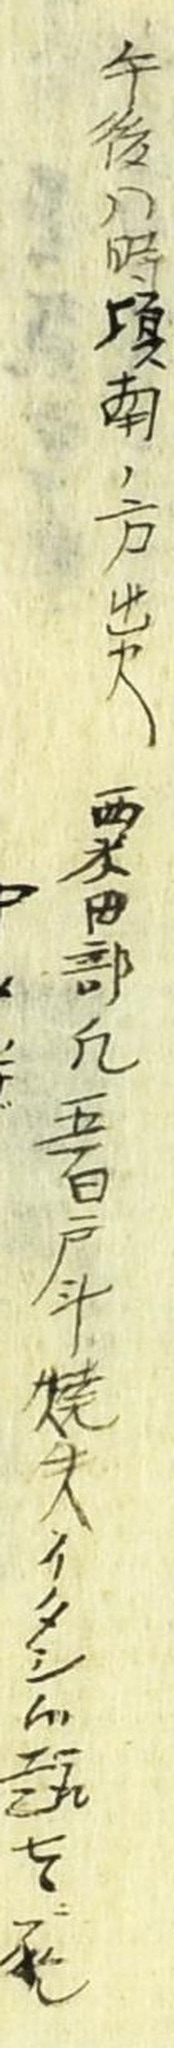午後八時頃南ノ方出火粟田部凡五百戸計消失イタシ候趣七日ニ承ル
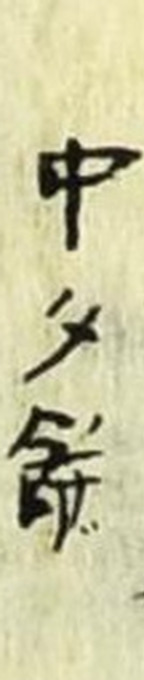中夕餅
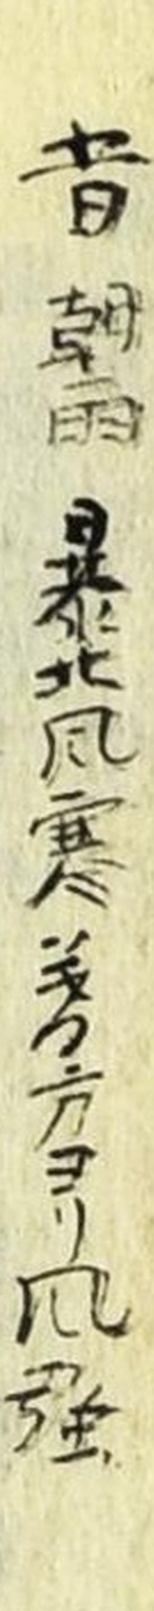五日朝雨暴北風寒暮方ヨリ風強煮豆
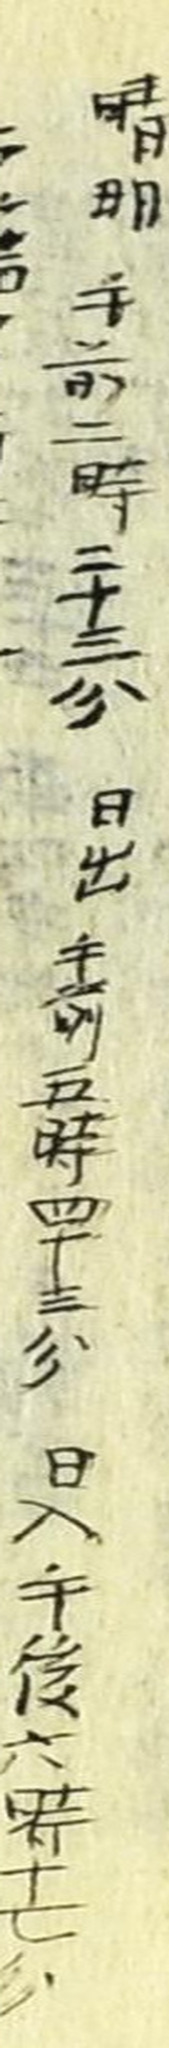晴明午前二時二十三分日出午前五時四十三分日入午後六時十七分
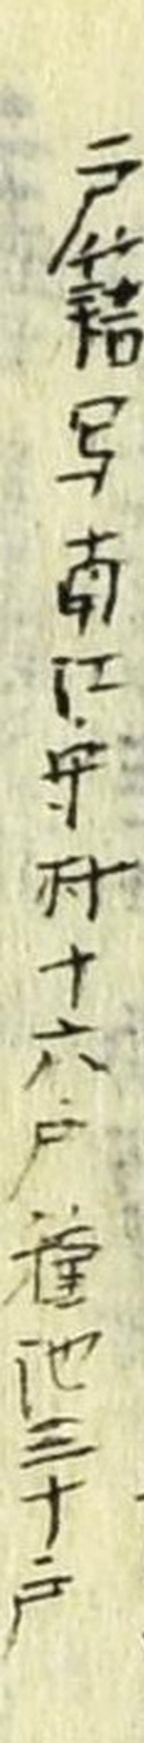戸籍写南江守村十六戸種池三十戸
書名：（日記）
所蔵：福井県文書館 Fukui Prefectural Archives
